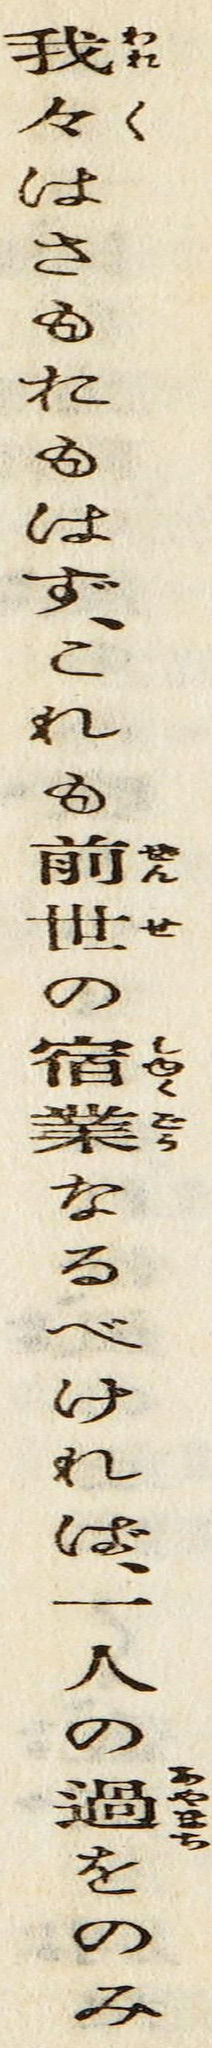我々はさもおもはず、これも前世の宿業なるべければ、一人の過をのみ
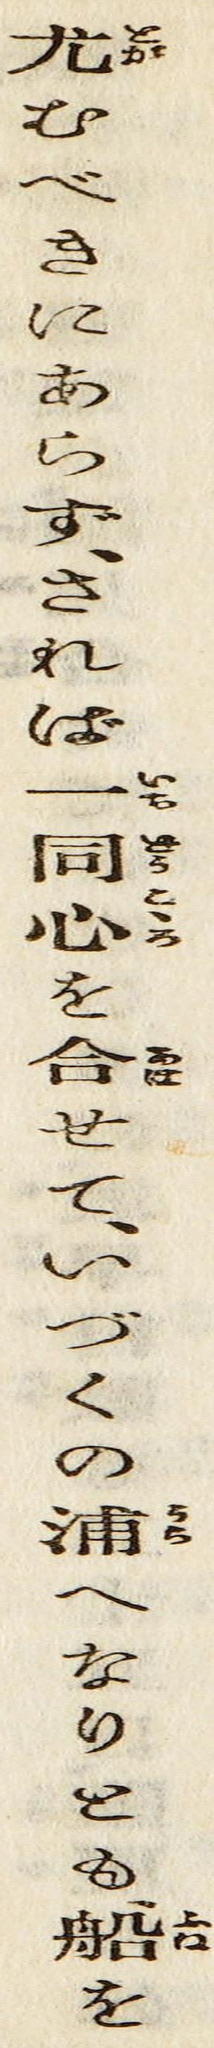尤むべきにあらず、されば一同心を合せて、いづくの浦へなりとも、船を
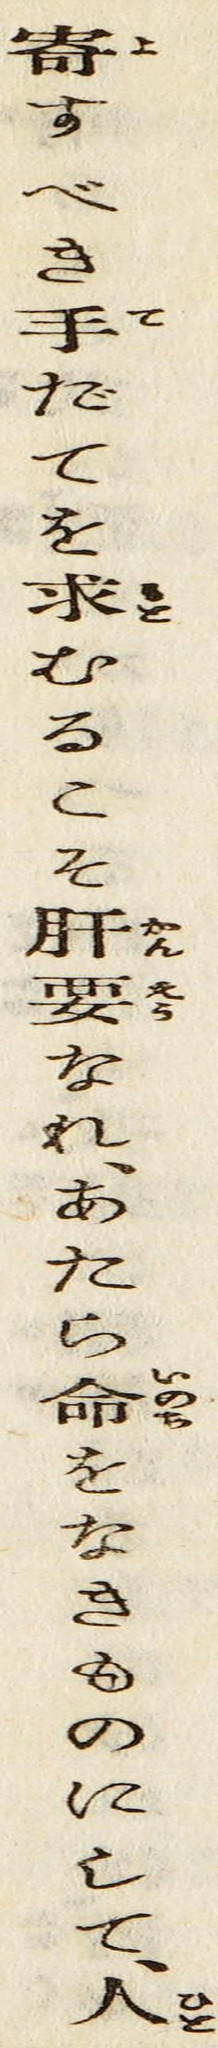寄すべき手だてを求むるこそ肝要なれ、あたら命をなきものにして、人
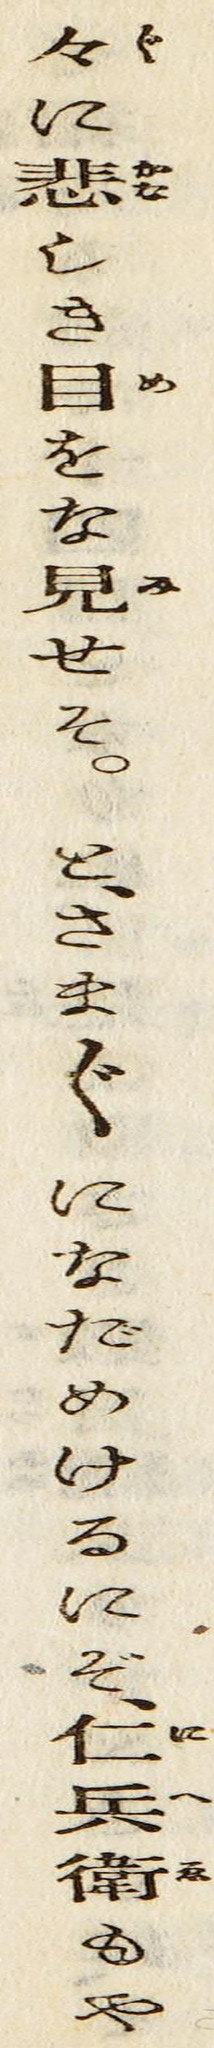々に悲しき目をな見せそ。と、さま〴〵になだめけるにぞ、仁兵衛もや
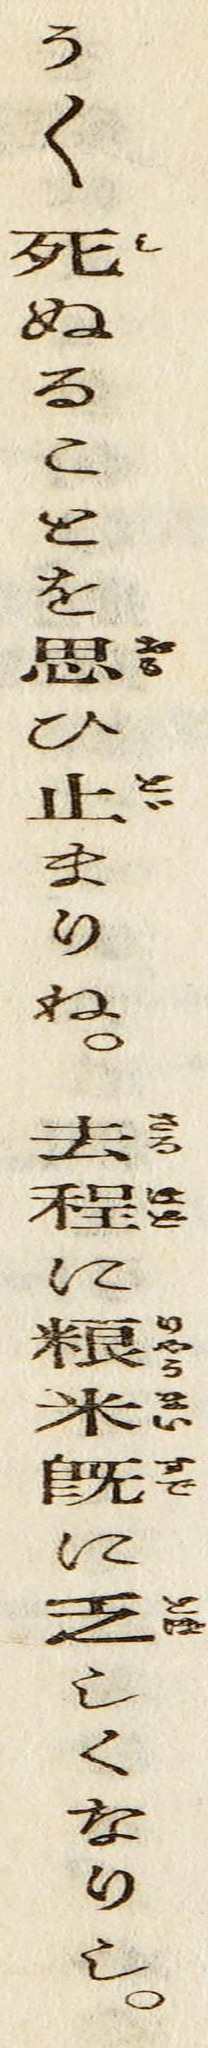う〳〵死ぬることを思ひ止まりね。去程に糧米既に乏しくなりし。
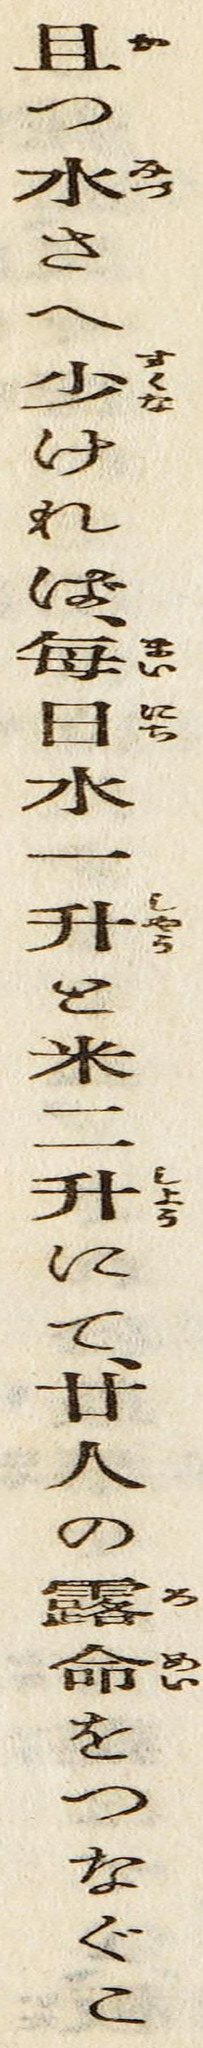且つ水さへ少ければ、毎日水一升と米二升にて、廿人の露命をつなぐこ
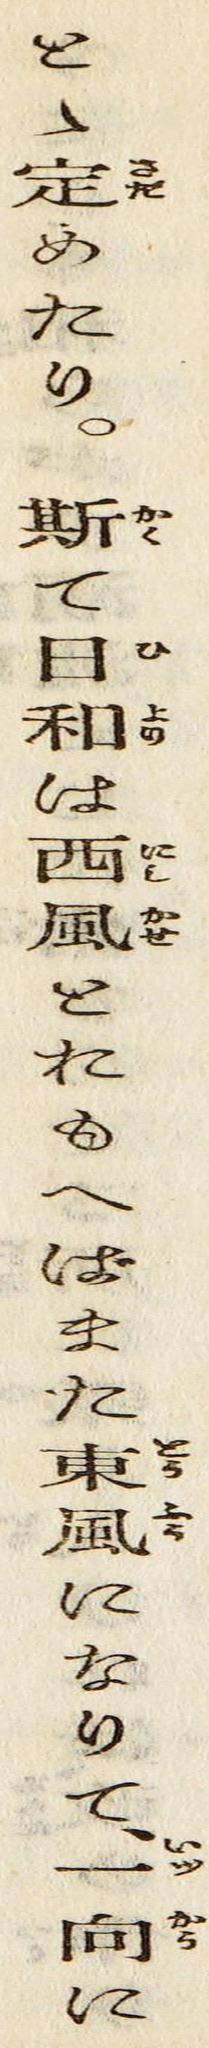とゝ定めたり。斯て日和は西風とおもへばまた東風になりて、一向に
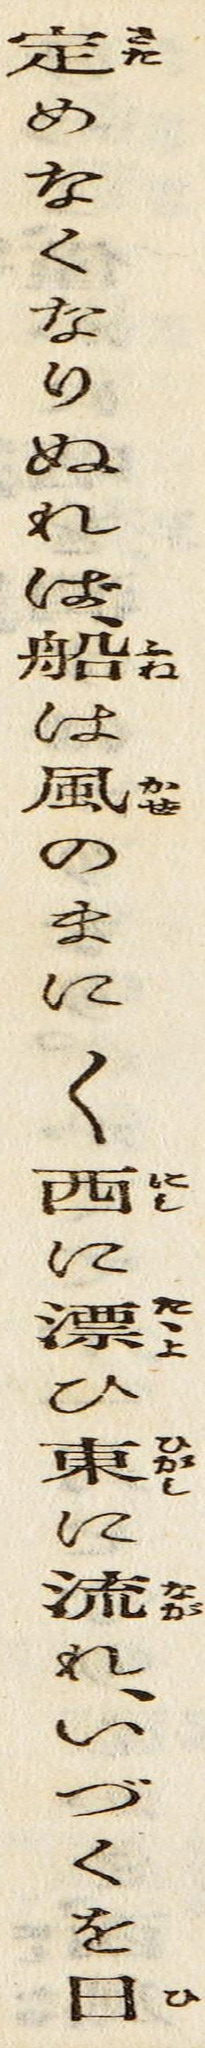定めなくなりぬれば、船は風のまに〳〵西に漂ひ東に流れ、いづくを日
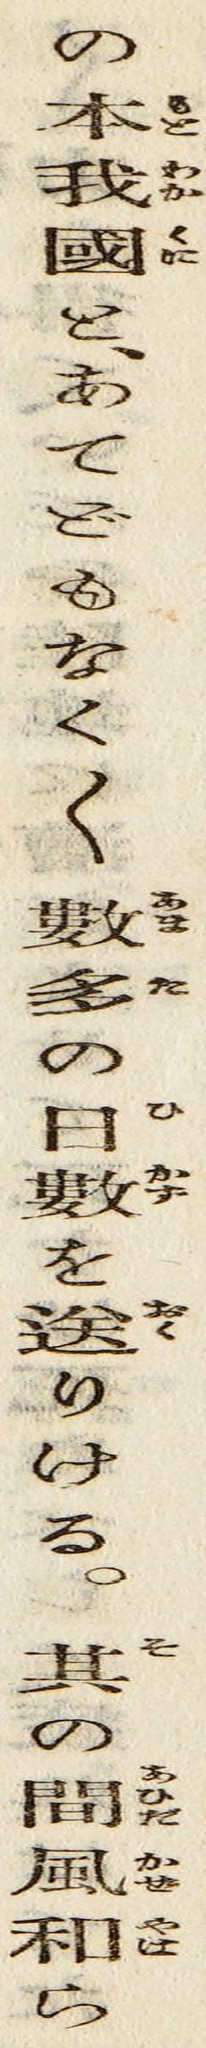の本我国と、あてどもなく〳〵数多の日数を送りける。其の間風和ら
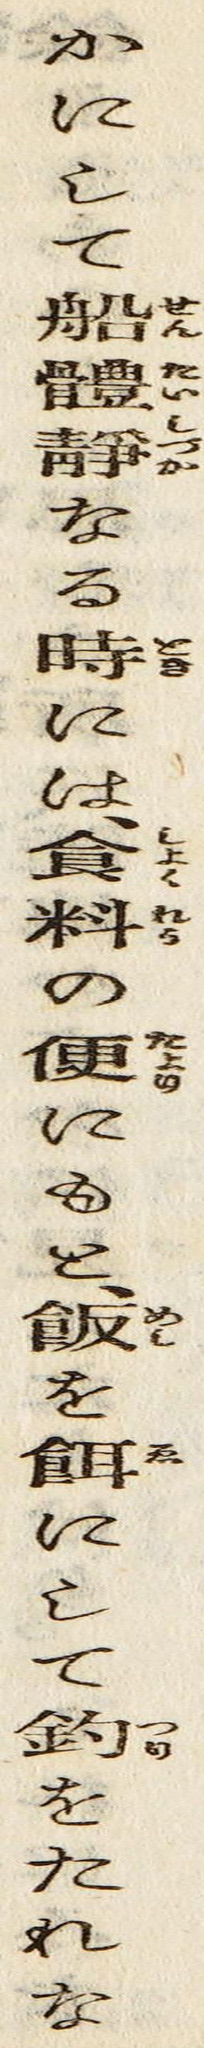かにして船体静なる時には、食料の便にもと、飯を餌にして釣をたれな
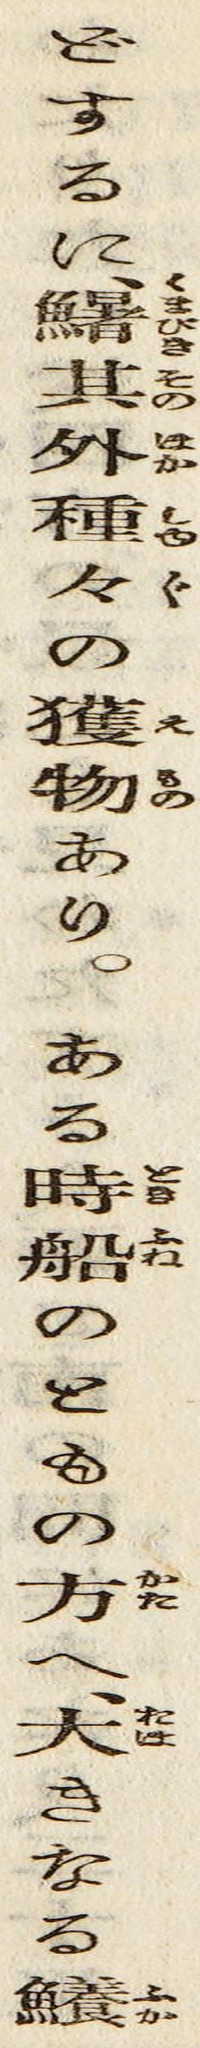どするに、鱪其外種々の獲物あり。ある時船のともの方へ、大きなる鱶
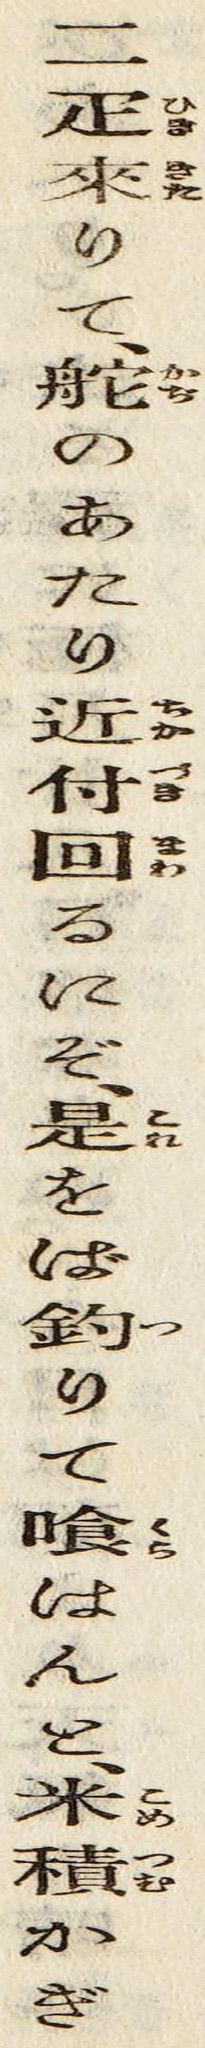二疋来りて、舵のあたり近付回るにぞ、是をば釣りて喰はんと、米積かぎ
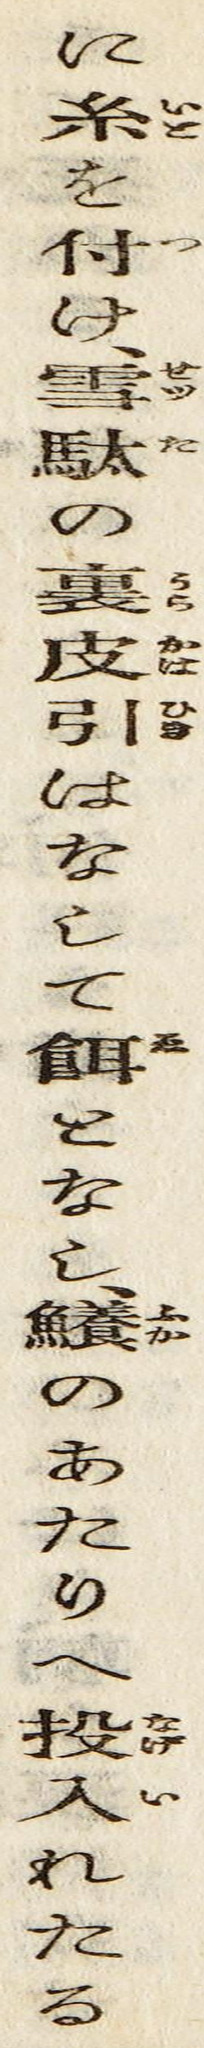に糸を付け、雪駄の裏皮引はなして餌となし、鱶のあたりへ投入れたる
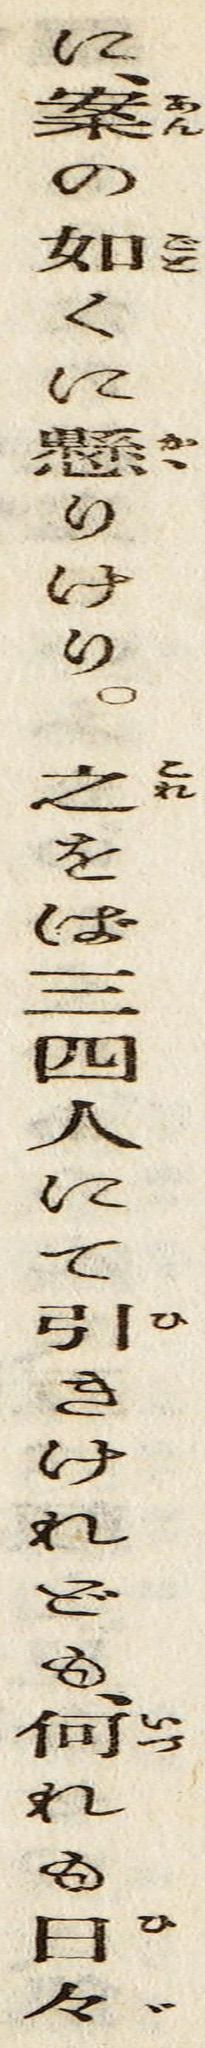に、案の如くに懸りけり。之をば三四人にて引きけれども、何れも日々
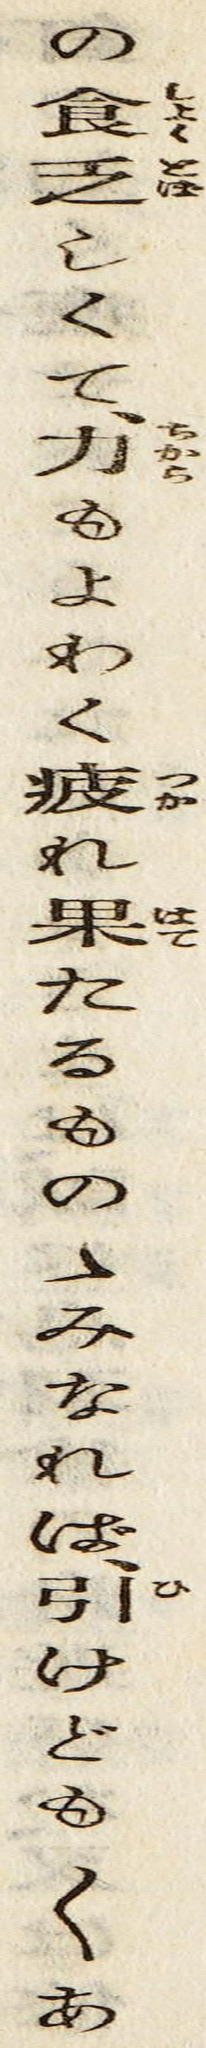の食乏しくて、力もよわく疲れ果たるものゝみなれば、引けども〳〵あ
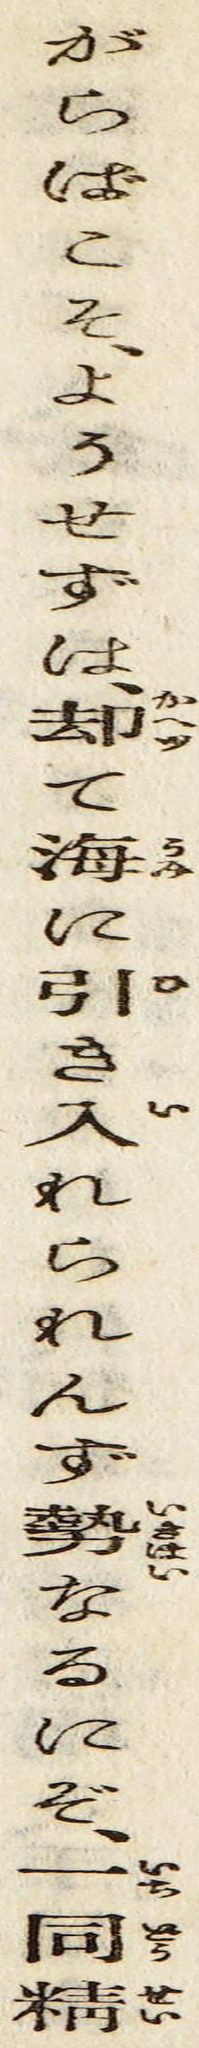がらばこそ、ようせずは、却て海に引き入れられんず勢なるにぞ、一同精
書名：日本漂流譚
